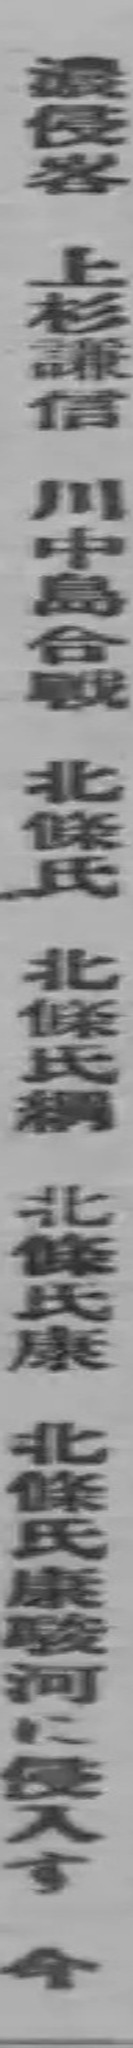濃侵略上杉謙信川中島合戦北条氏北条氏綱北条氏康北条氏康駿河に侵入す今
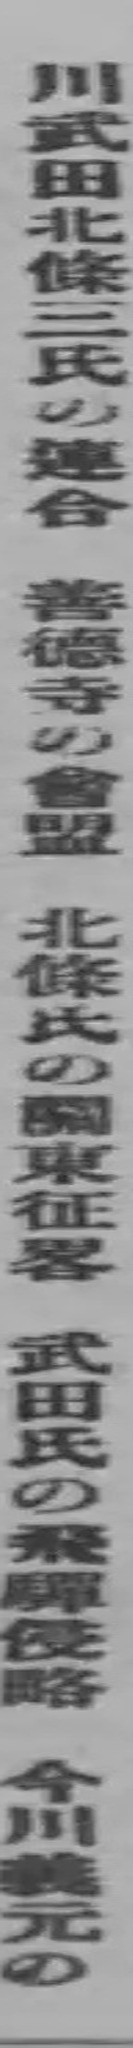川武田北条三氏の連合善徳寺の会盟北条氏の関東征略武田氏の飛騨侵略今川義元の
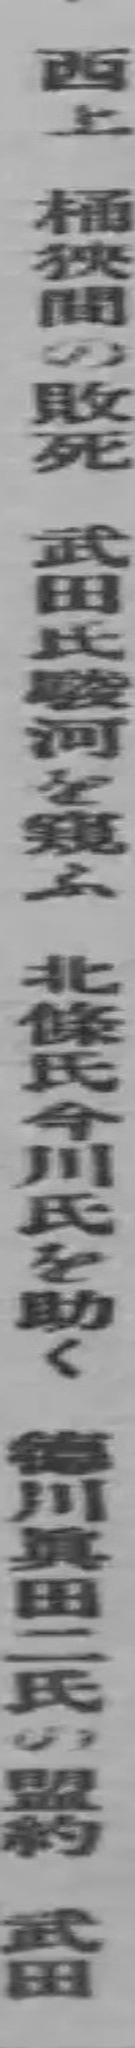西上桶狭間の敗死武田氏駿河を窺ふ北条氏今川氏を助く徳川真田二氏の盟約武田
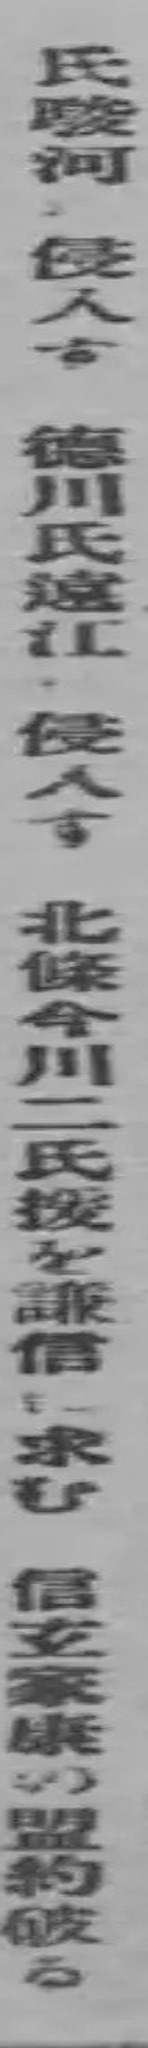氏駿河に侵入す徳川氏遠江に侵入す北条今川二氏援を謙信に求む信玄家康の盟約破る
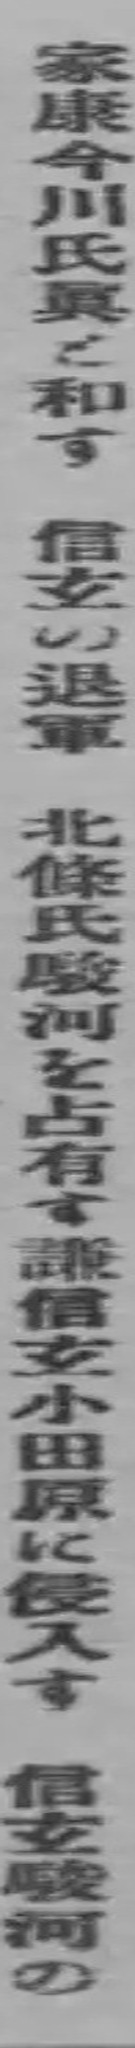家康今川氏眞と和す信玄の退軍北条氏駿河を占有す謙信玄小田原に侵入す信玄駿河の
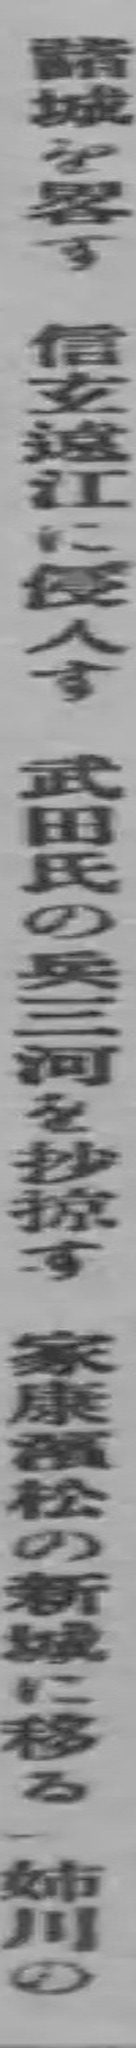諸城を略す信玄遠江に侵入す武田氏の兵三河を抄掠す家康浜松の新城に移る姉川の
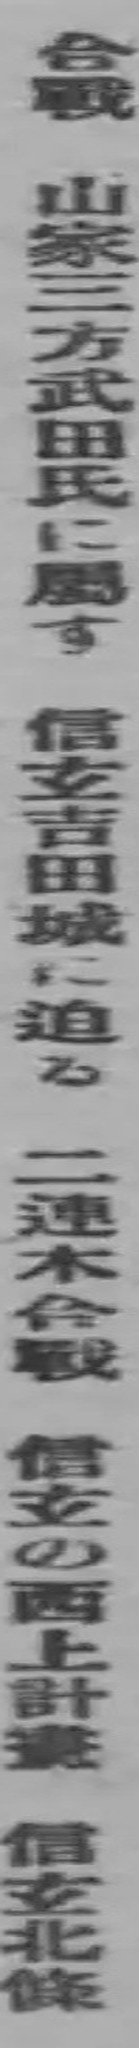合戦山家三方武田氏に属す信玄吉田城に迫る二連木合戦信玄の西上計画信玄北条
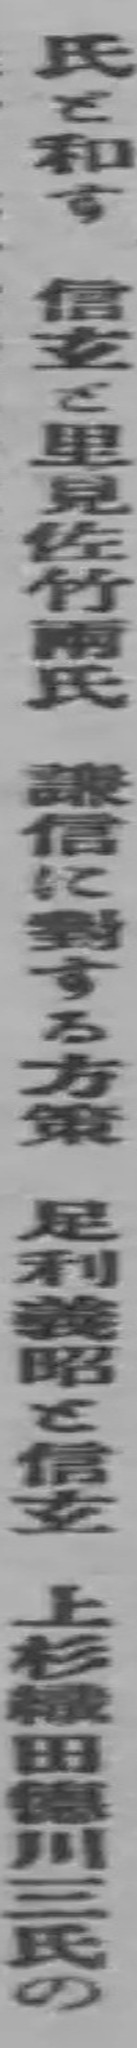氏と和す信玄と里見佐竹両氏謙信に対する方策足利義昭と信玄上杉織田徳川三氏の
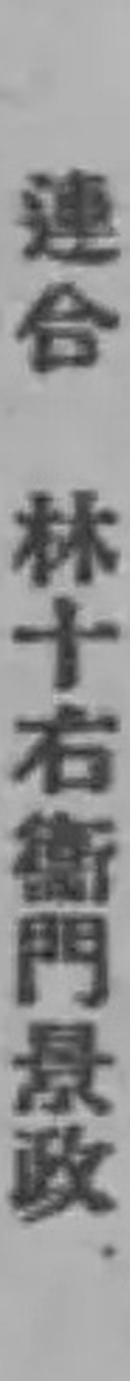連合林十右衛門景政
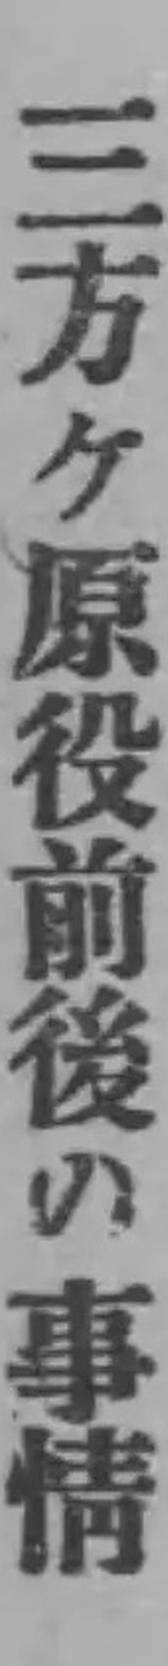三方ヶ原役前後の事情

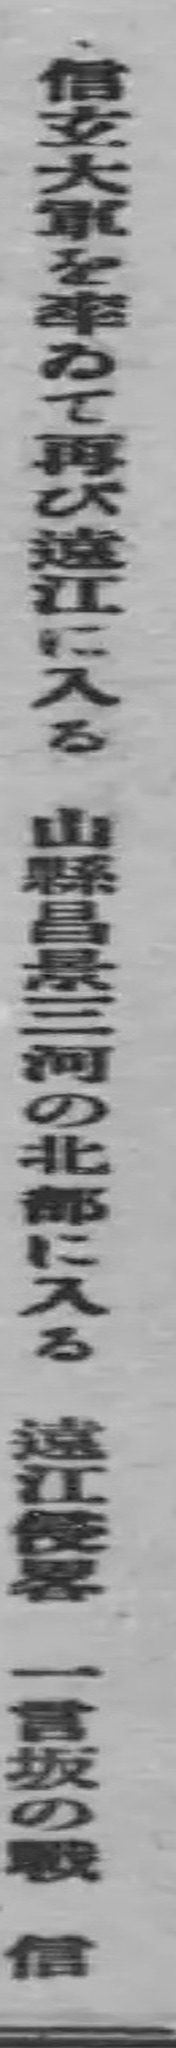信玄大軍を率ゐて再び遠江に入る山縣昌景三河の北部に入る遠江侵略一言坂の戦信
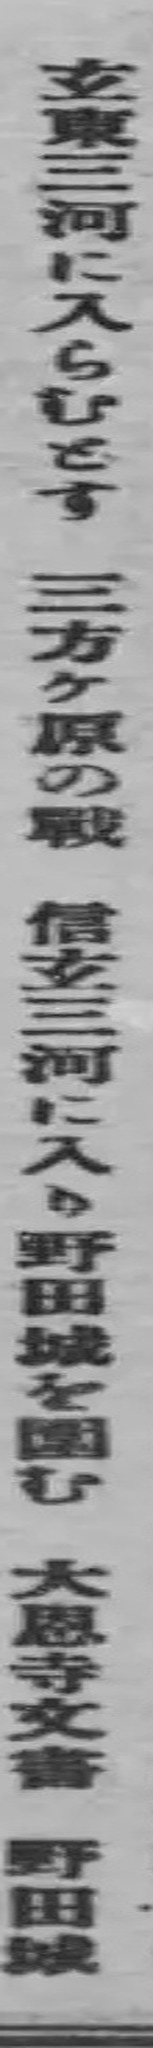玄東三河に入らむとす三方ヶ原の戦信玄三河に入り野田城を囲む大恩寺文書野田城
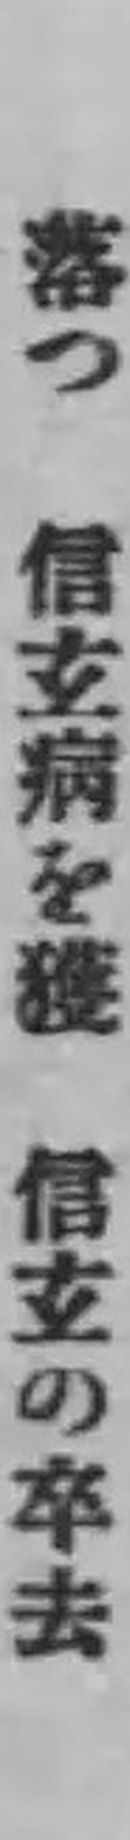落つ信玄病を獲信玄の卒去
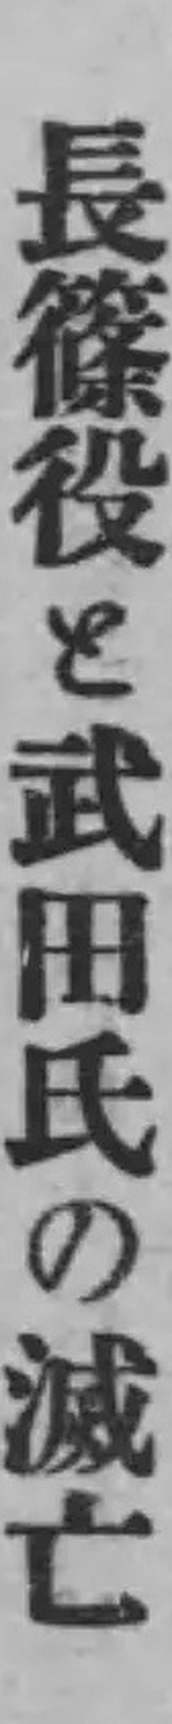長篠役と武田氏の滅亡
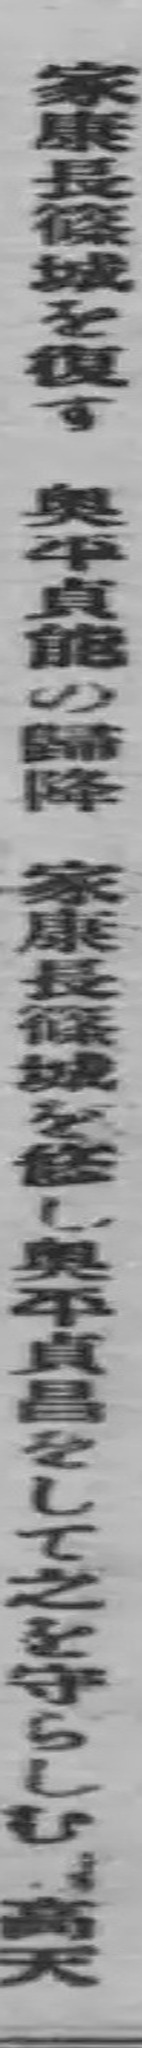家康長篠城を復す奥平貞能の帰降家康長篠城を修し奥平貞昌をして之を守らしむ高天
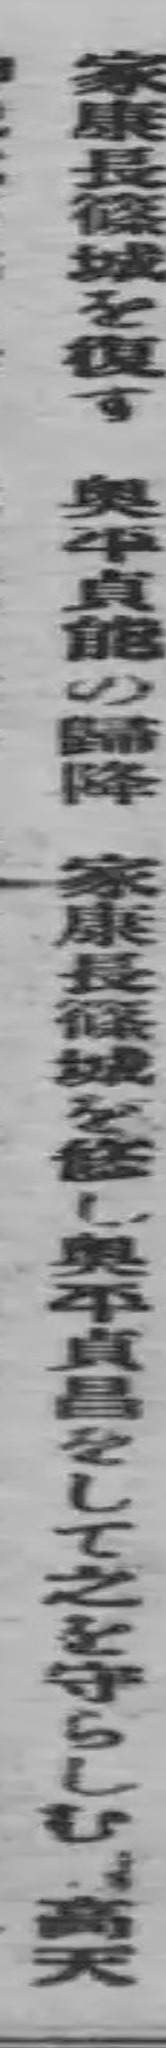家康長篠城を復す奥平貞能の帰降家康長篠城を修し奥平貞昌をして之を守らしむ高天
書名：豊橋市史談
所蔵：国立国会図書館 National Diet Library, JAPAN
